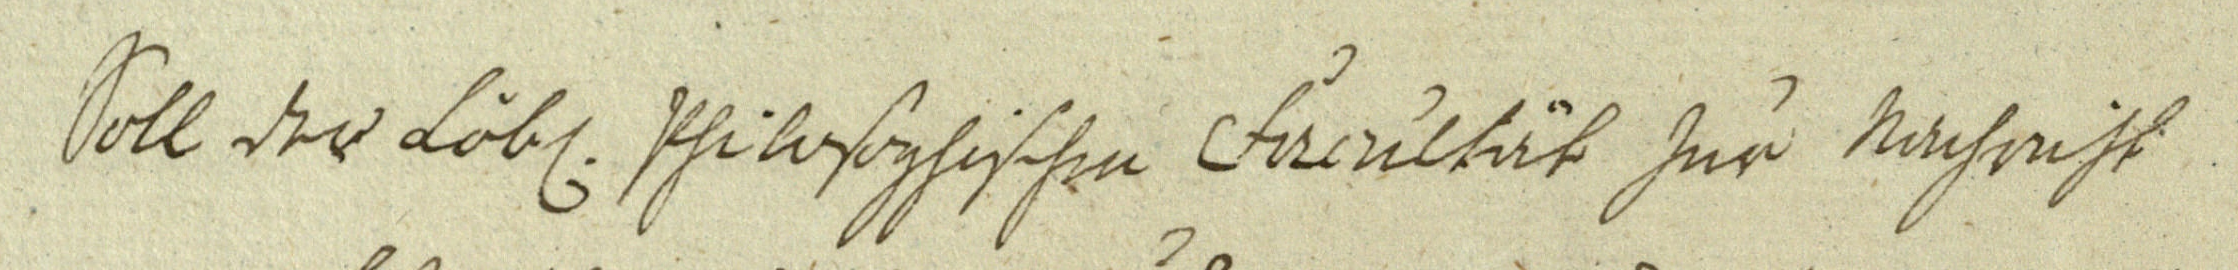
Soll der Löbl. Philosophischen Facultät zur Nachricht
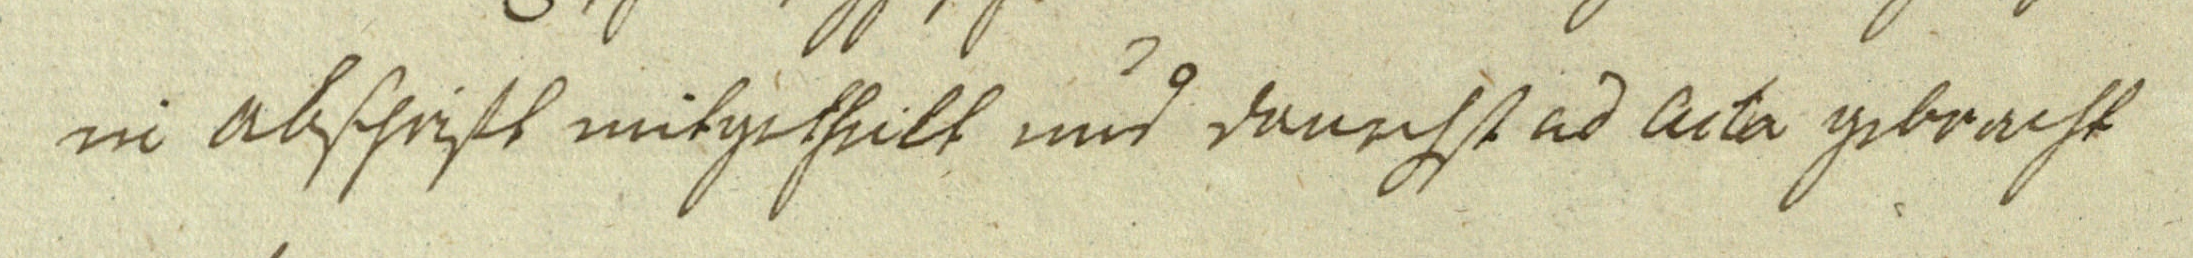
in Abschrift mitgetheilt und danechst ad Acta gebracht
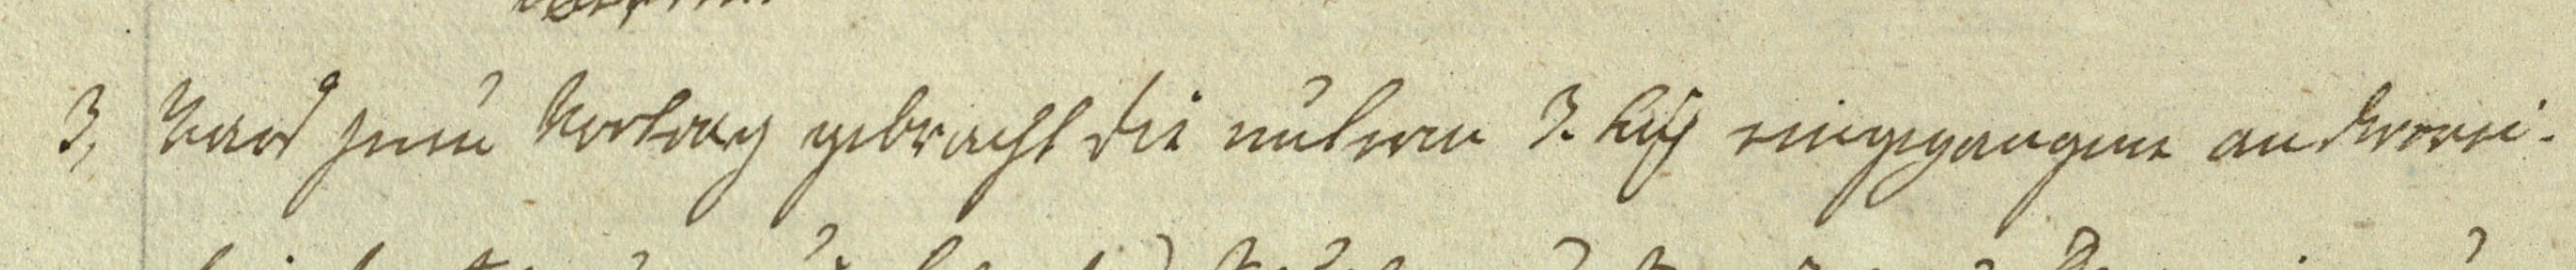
3, Ward zum Vortrag gebracht die unterm 3. huj eingegangene anderwei¬
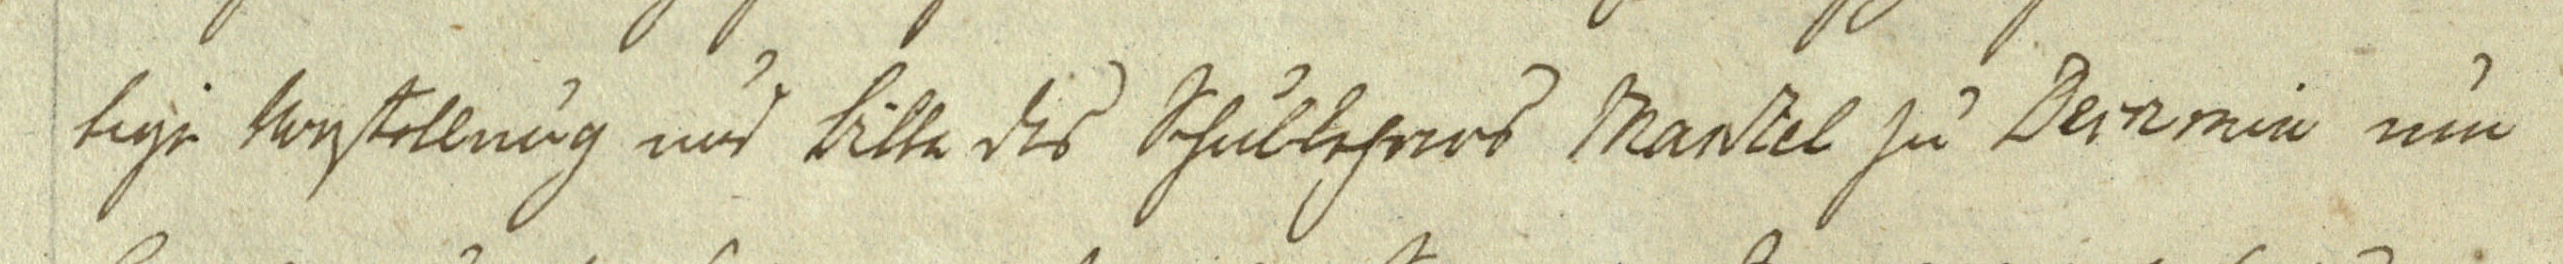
tige Vorstellung und Bitte des Schullehrers Manzel zu Demmin um
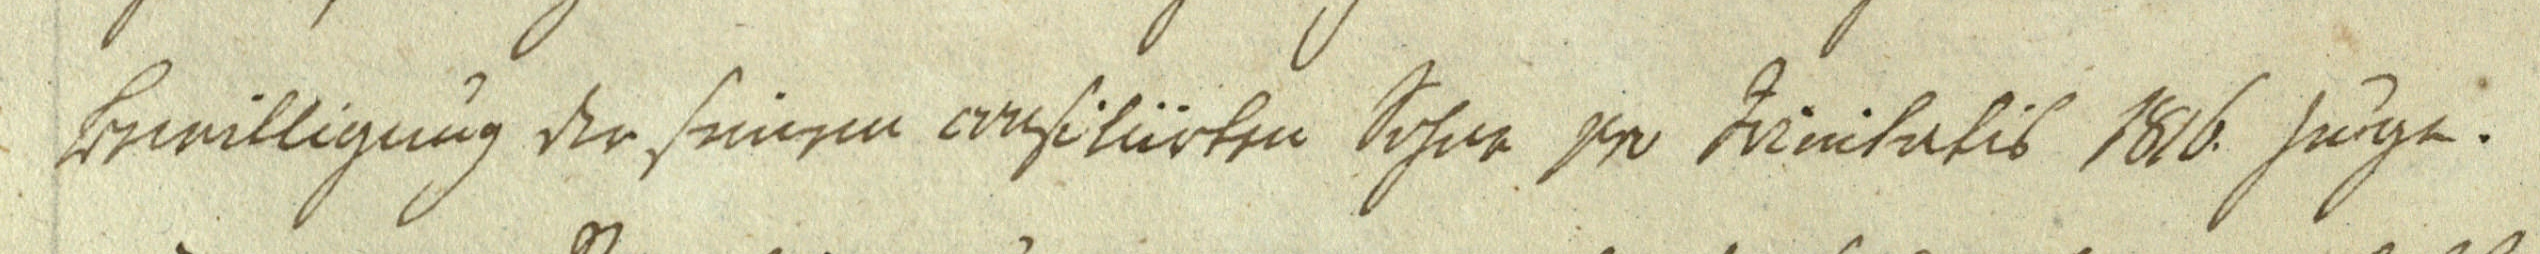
Bewilligung der seinem cosiliirten Sohne pro Trinitatis 1816. zuge¬
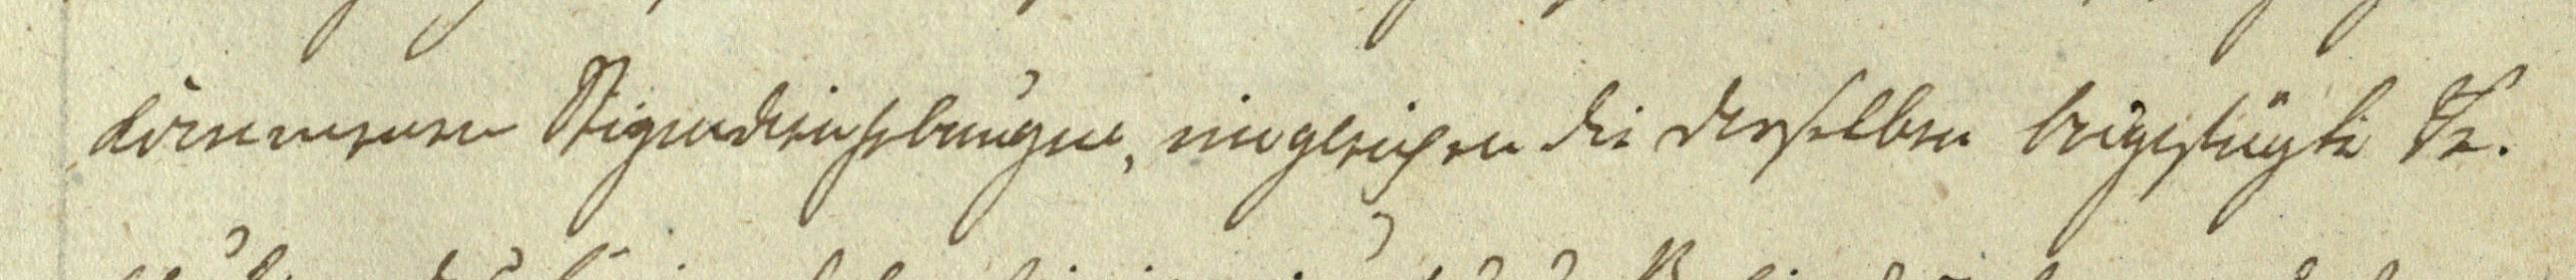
kommenen Stipendienhebungen, imgleichen die derselben beigefügte Re¬
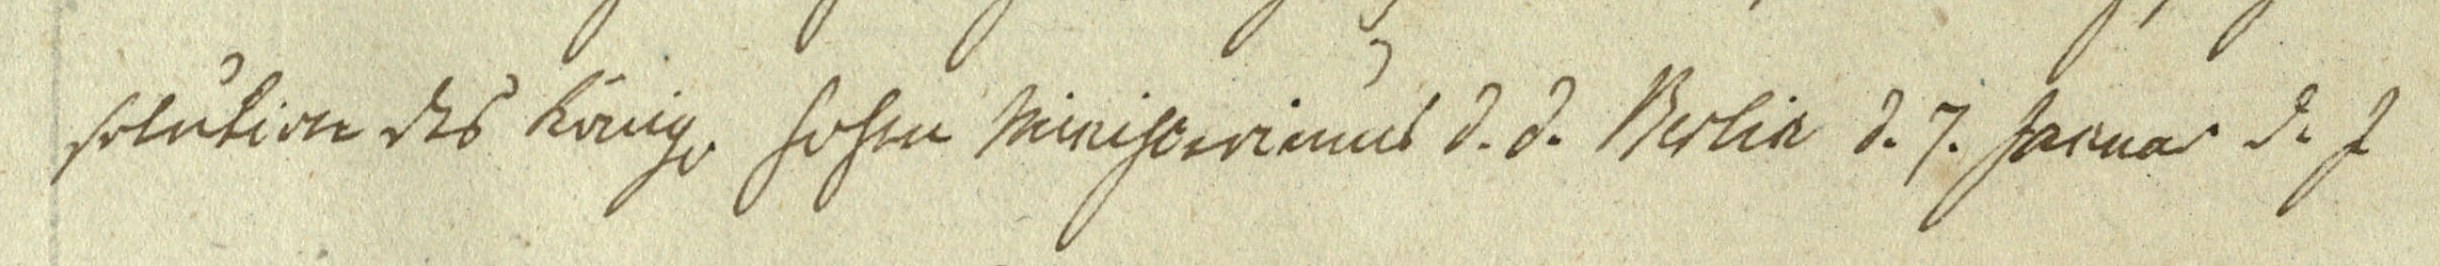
solution des König hohen Ministeriums d. d. Berlin d. 7. Januar d. J.
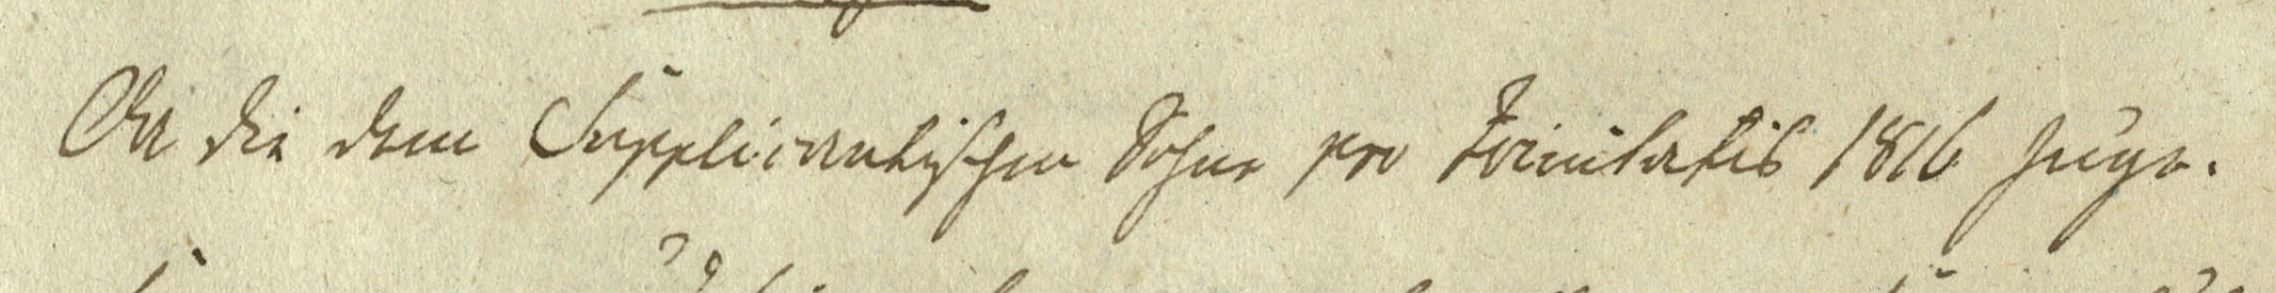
Da die dem Supplicantischen Sohne pro Trinitatis 1816 zuge¬
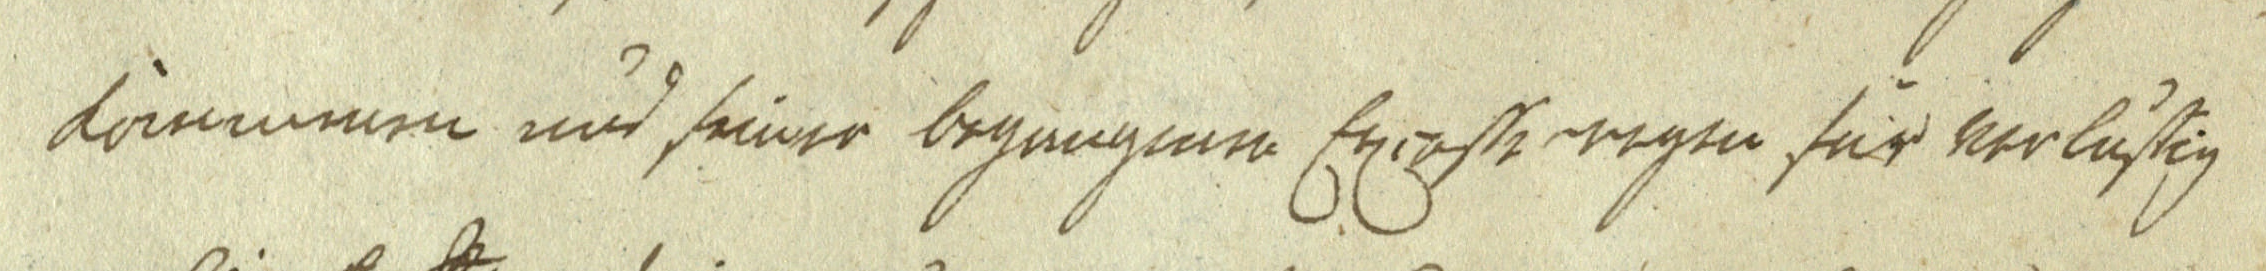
kommenen und seiner begangenen Excesse wegen für verlustig
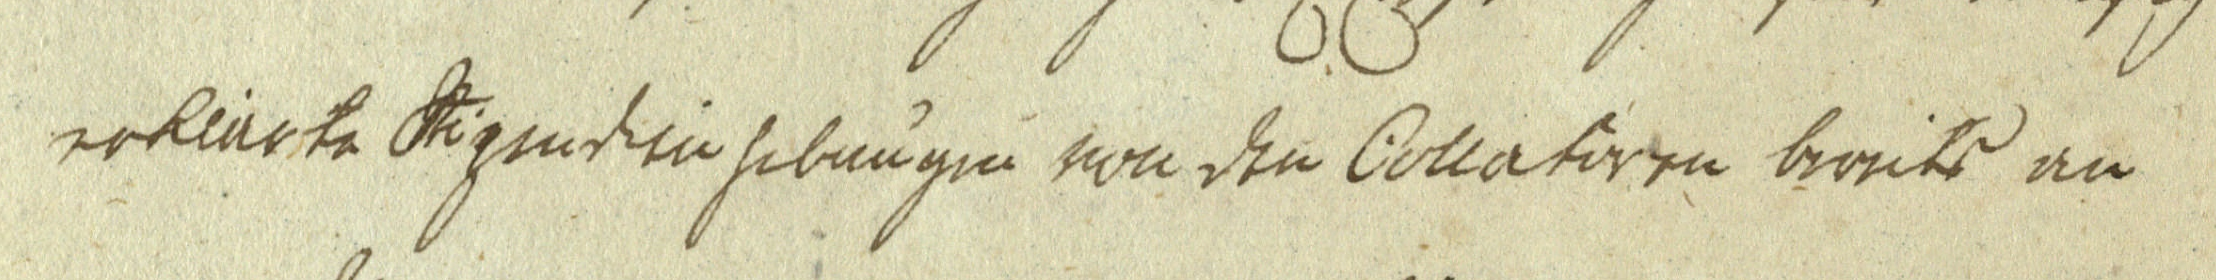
erklärte Stipendienhebungen von den Collatoren bereits an
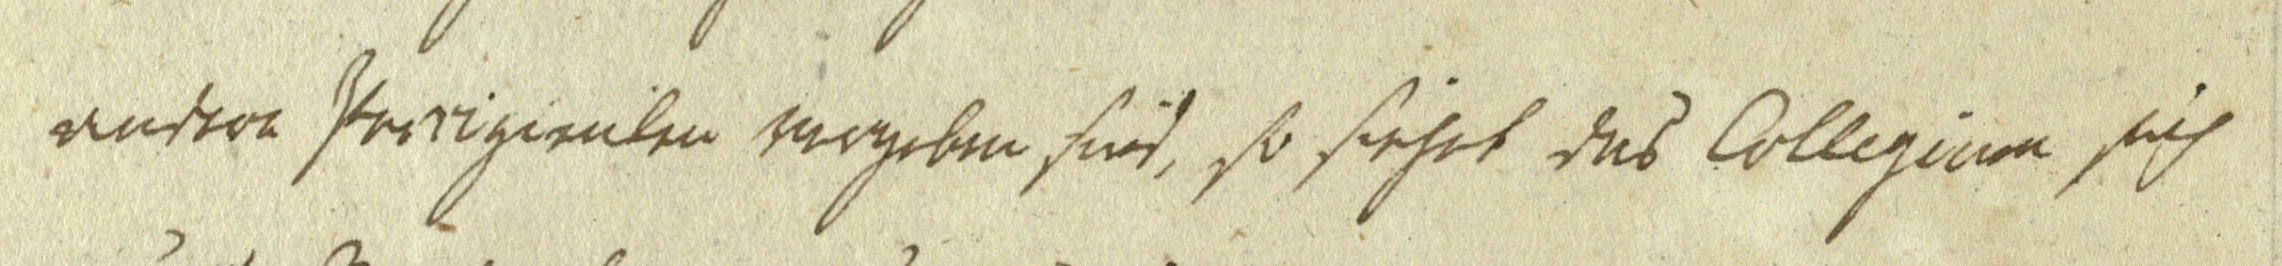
andere Percipienten vergeben sind, so siehet das Collegium sich
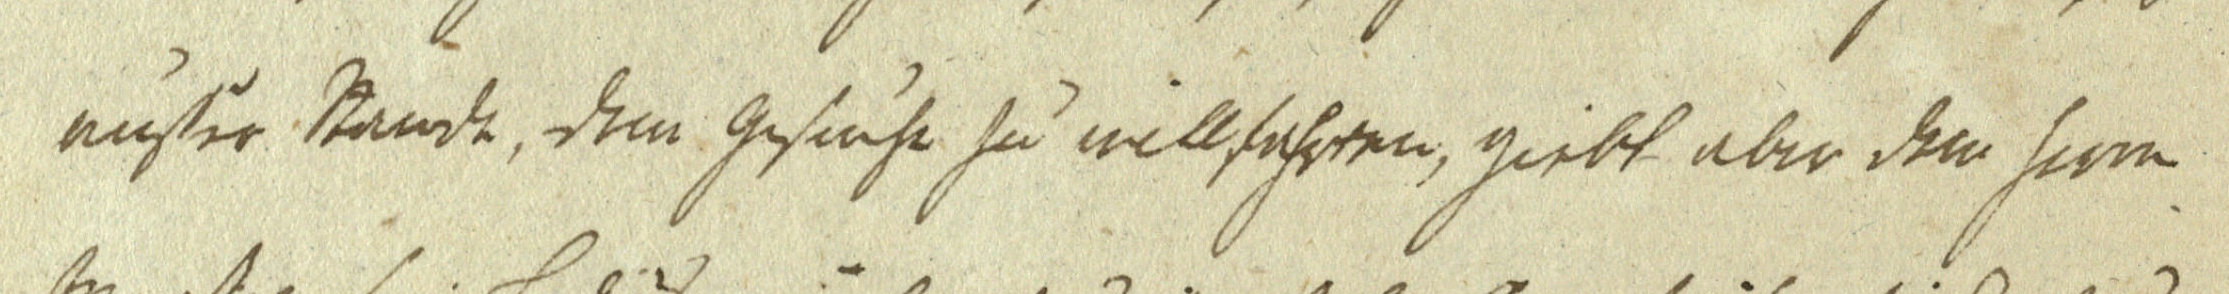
ausser Stande, dem Gesuche zu willfahren, giebt aber dem Herrn
